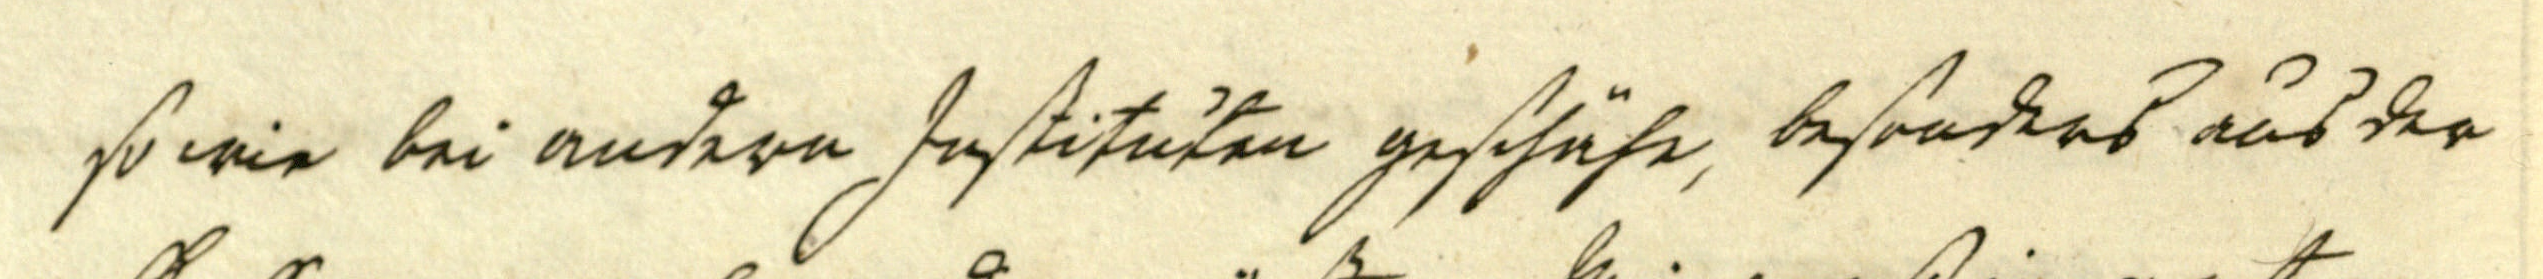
so wie bei andern Instituten geschähe, besonders aus der
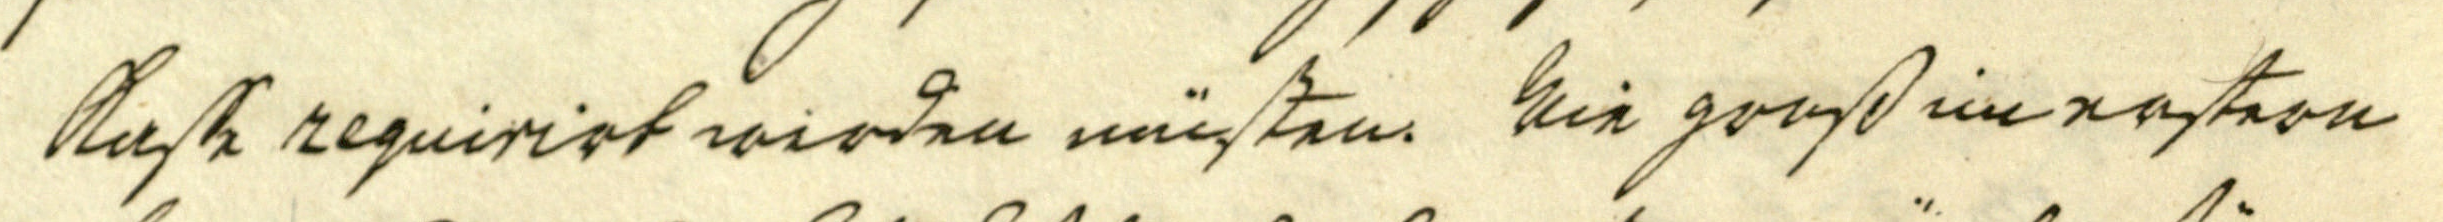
Kasse requirirt werden müßten. Wie groß im erstern
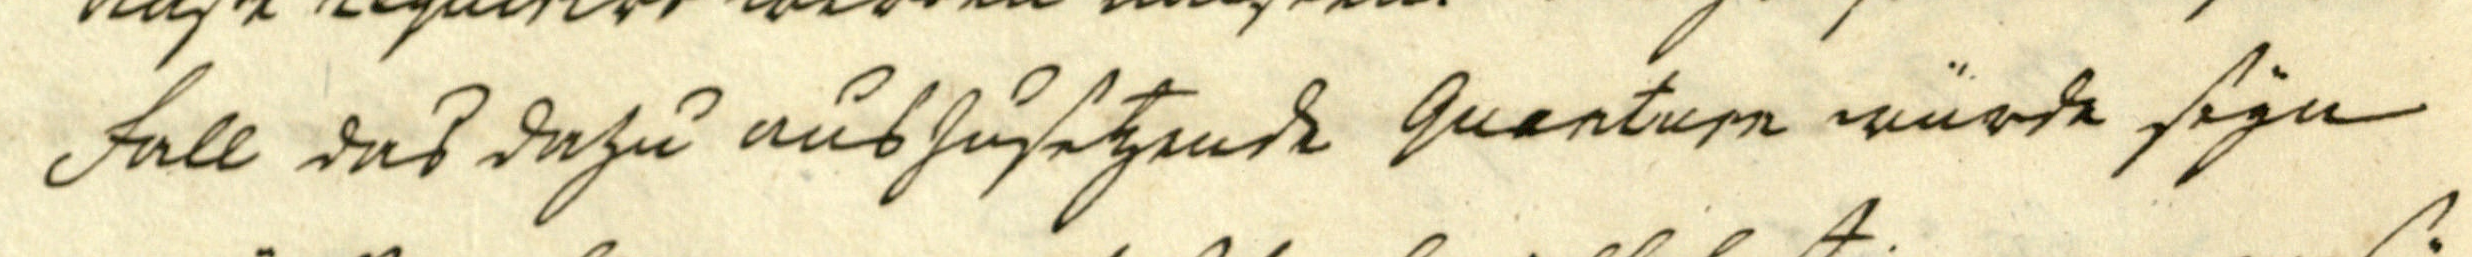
Fall das dazu aus zusetzende Quantum würde seÿn
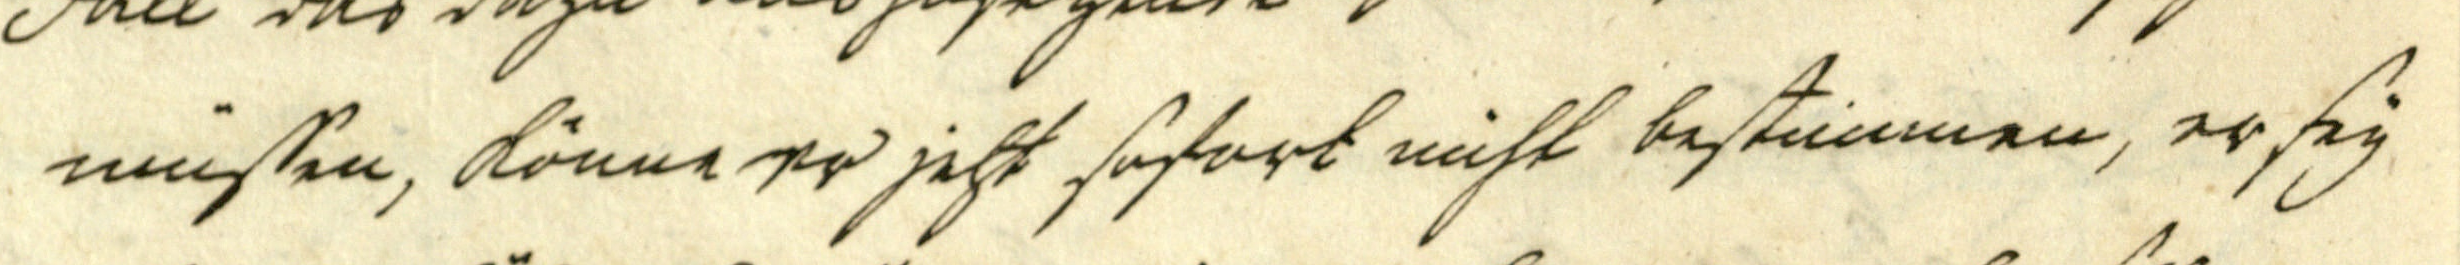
müssen, könne er jetzt sofort nicht bestimmen, er seÿ
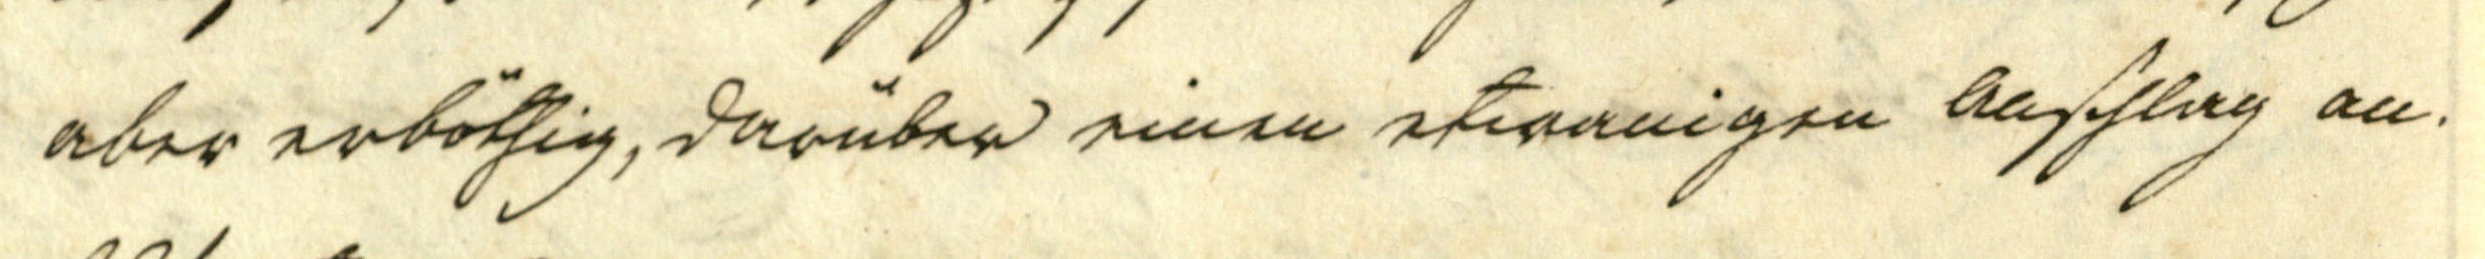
aber erböthig, darüber einen etwanigen Anschlag an¬
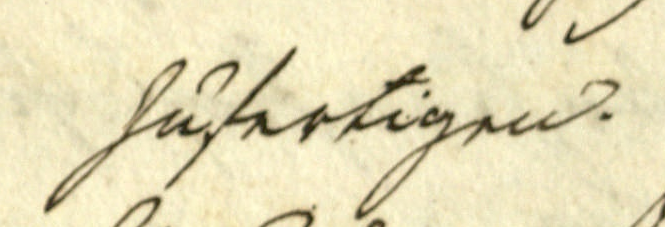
zufertigen.
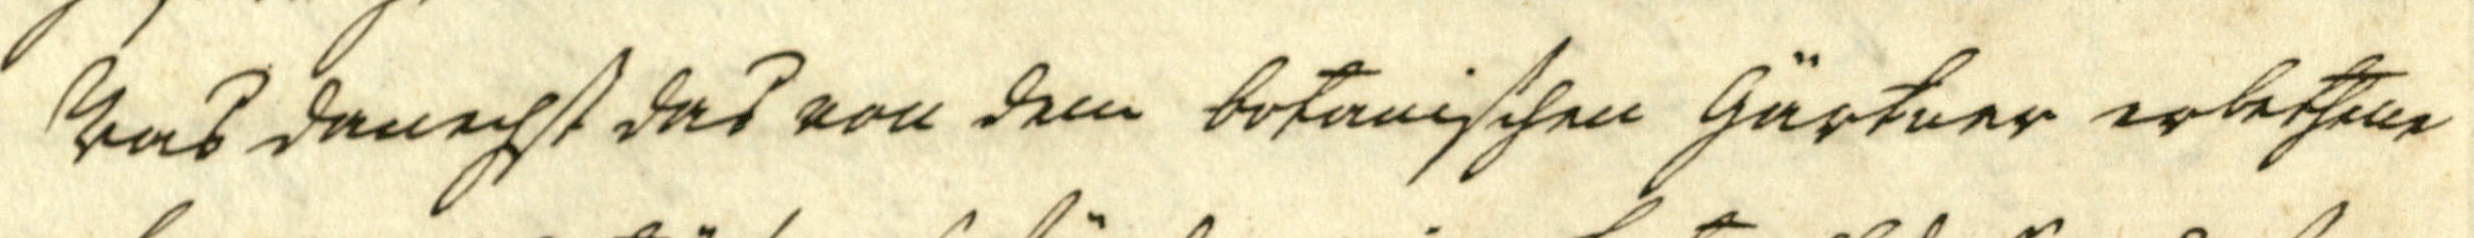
Was danechst das von dem botanischen Gärtner erbethene
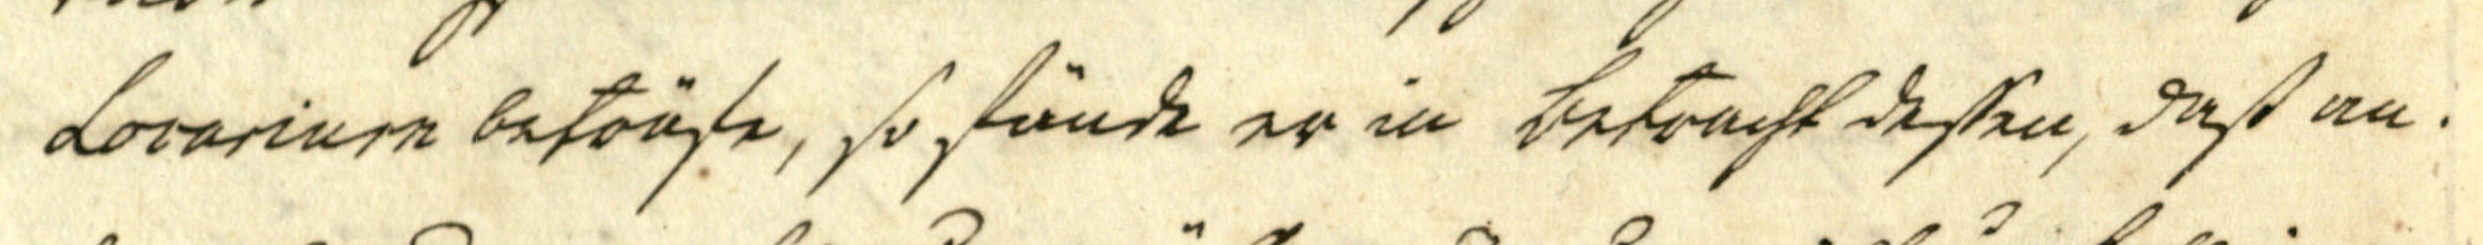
Locarium beträfe, so fände er in Betracht dessen, daß an¬
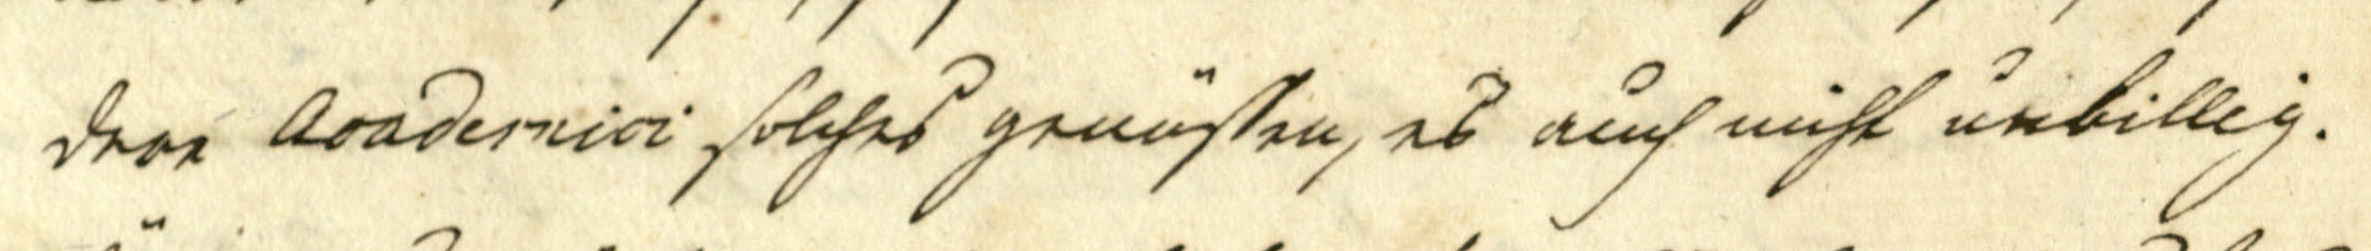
dere Academici solches genössen, es auch nicht unbillig.
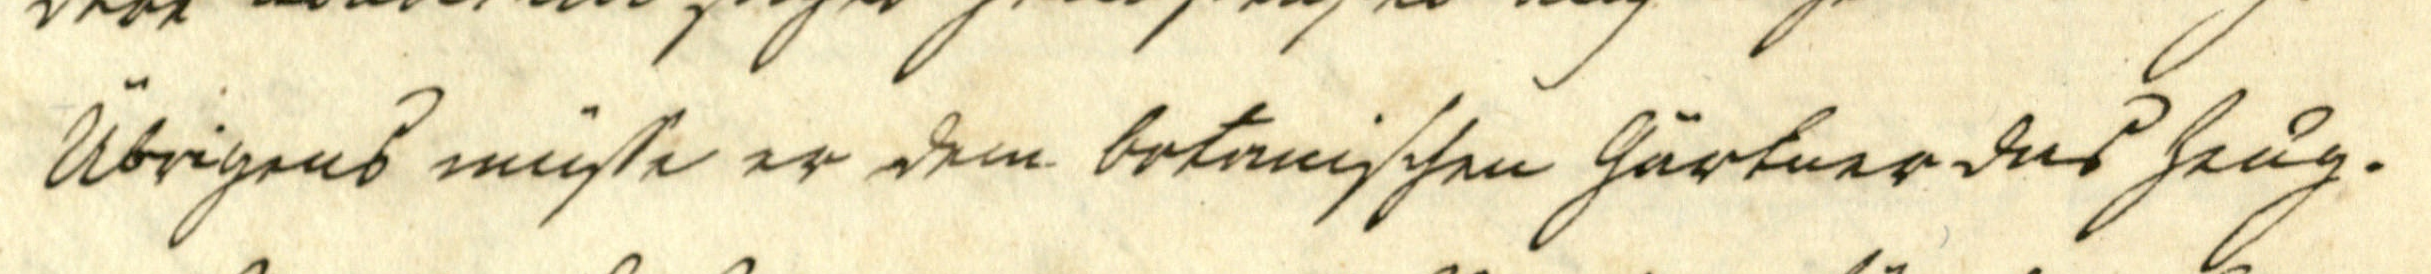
Übrigens müsse er dem botanischen Gärtner das Zeug¬
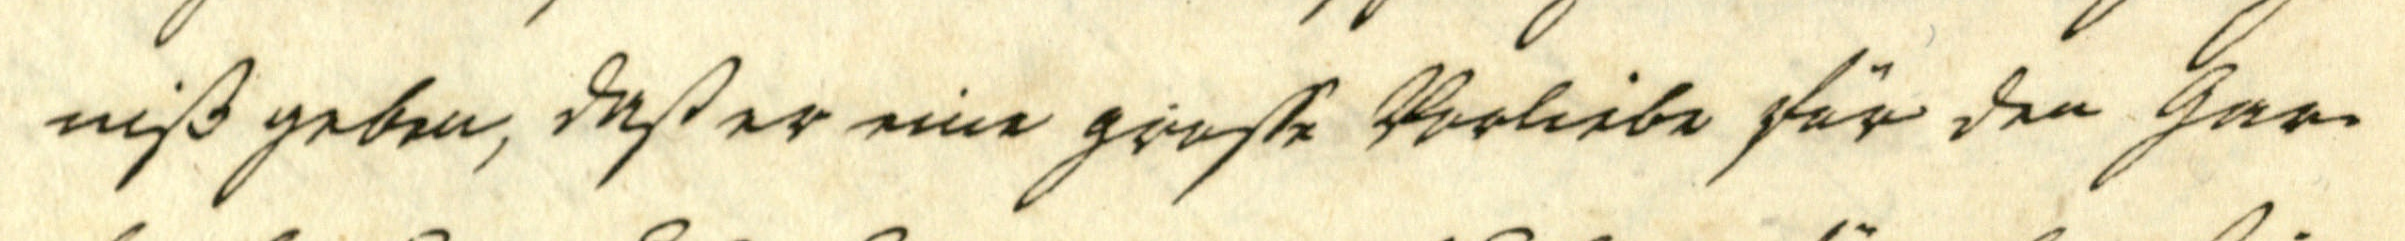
niß geben, daß er eine grosse Vorliebe für den Gar¬
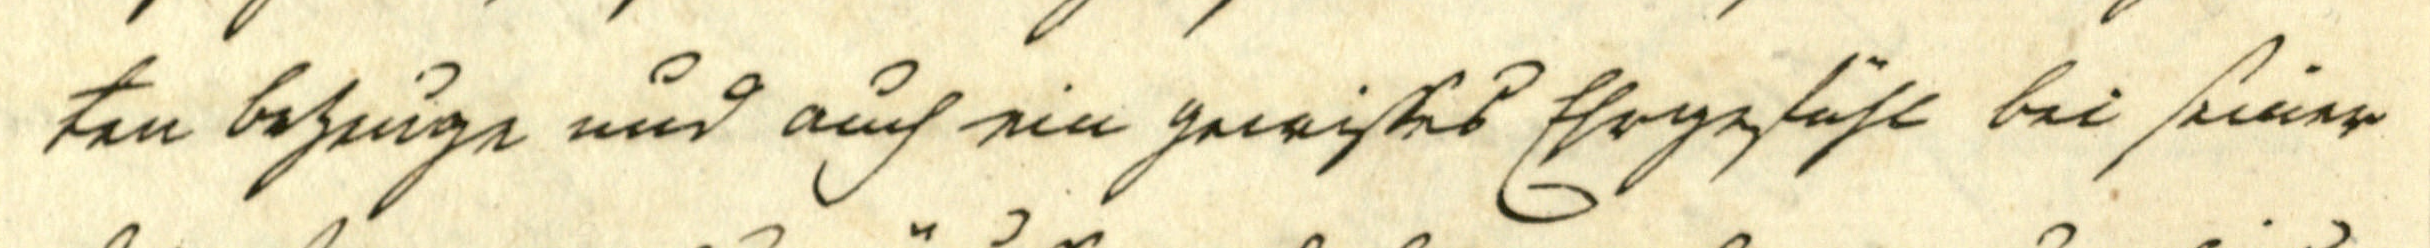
ten bezeuge und auch ein gewisses Ehrgefühl bei seiner
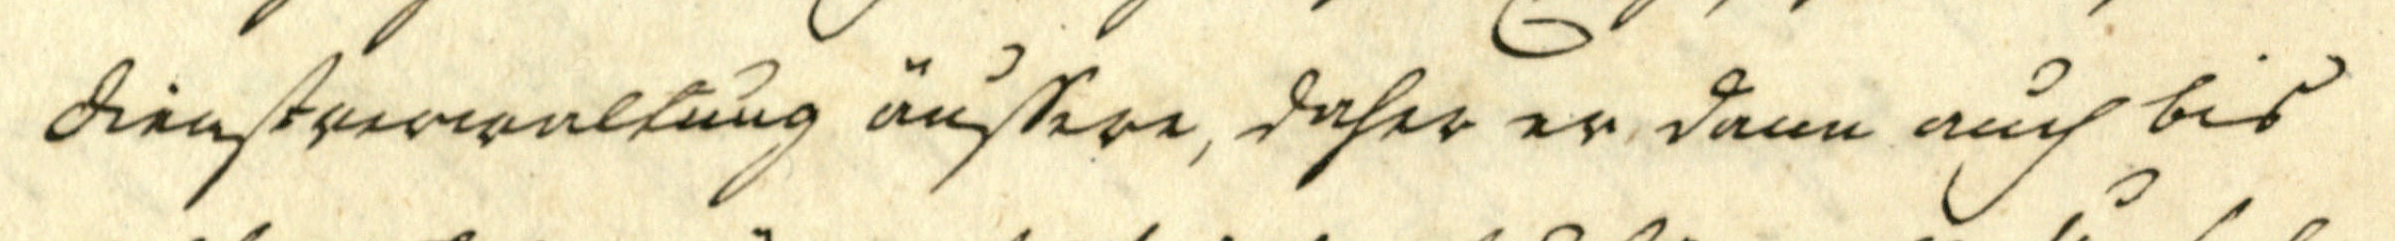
Dienstverwaltung äussere, daher er dann auch bis
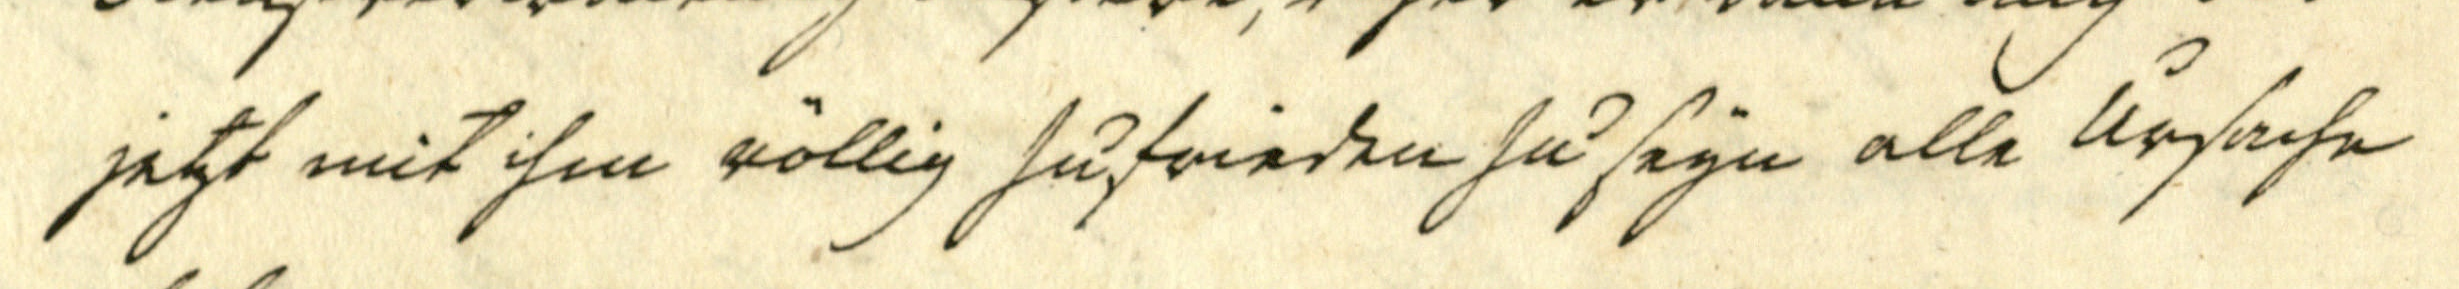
jetzt mit ihm völlig zufrieden zu seÿn alle Ursache
